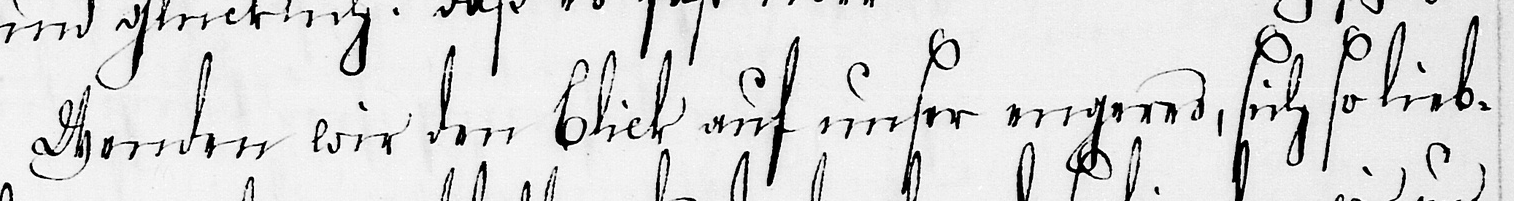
Wenden wir den Blick auf unser engeres, sich so lie¬
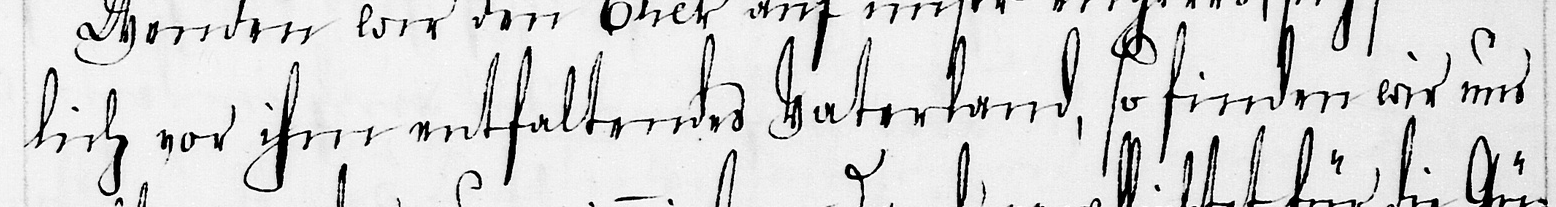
blich vor ihm entfaltendes Vaterland, so finden wir uns
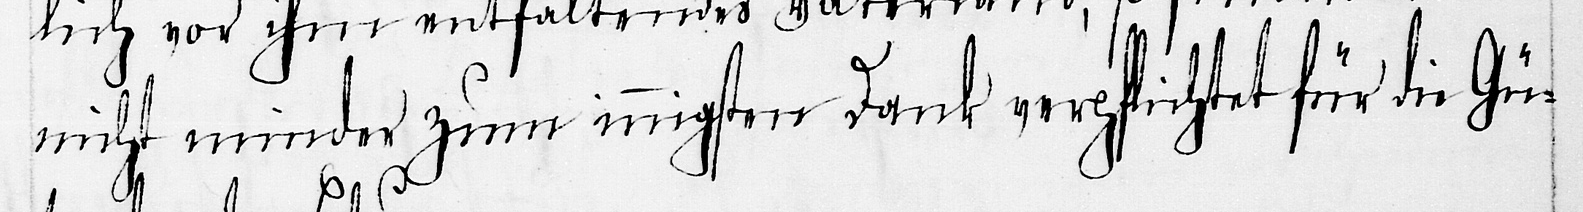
nicht minder zum innigsten Dank verpflichtet für die Gü¬
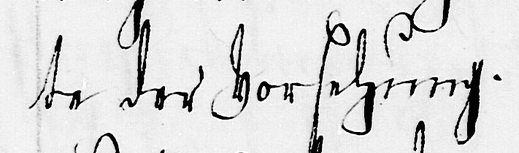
te der Vorsehung.
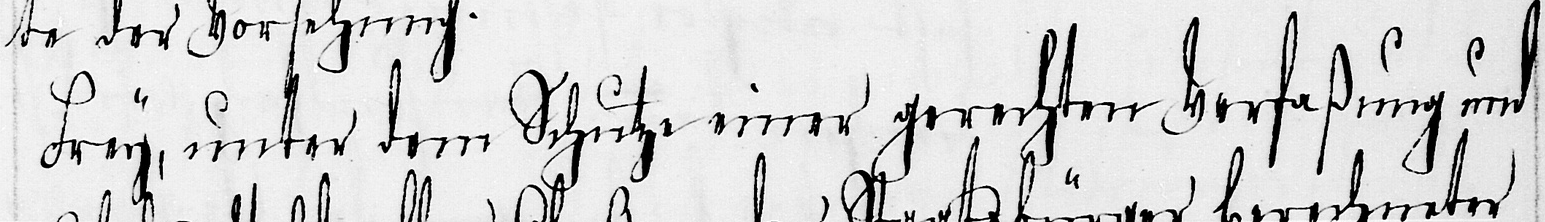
Frey, unter dem Schutze einer gerechten Verfaßung und
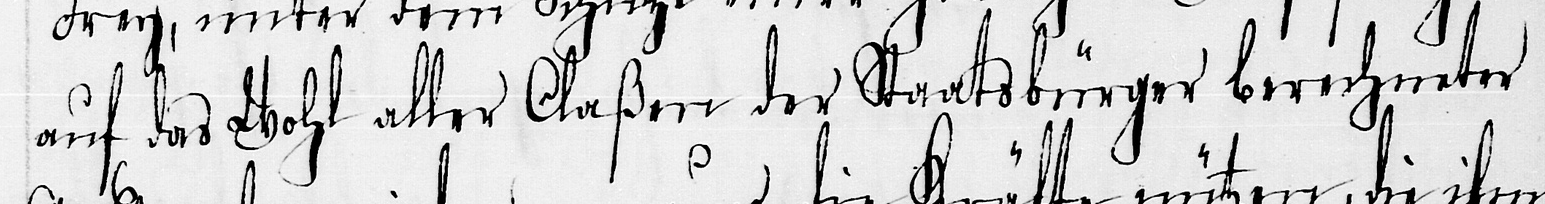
auf das Wohl aller Claßen der Staatsbürger berechneter
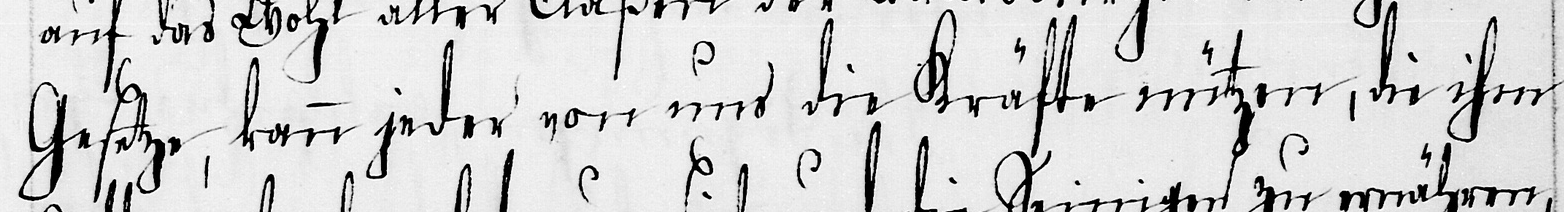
Gesetze, kann jeder von uns die Kräfte nützen, die ihm
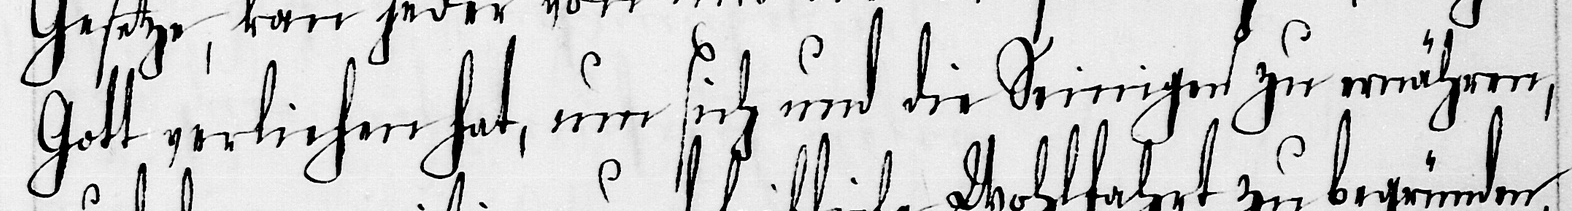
Gott verliehen hat, um sich und die Seinigen zu ernähren,
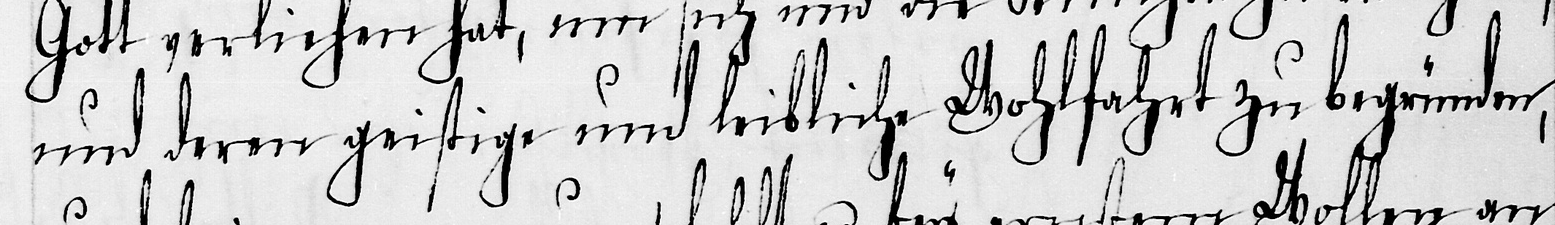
und deren geistige und leibliche Wohlfahrt zu begründen,
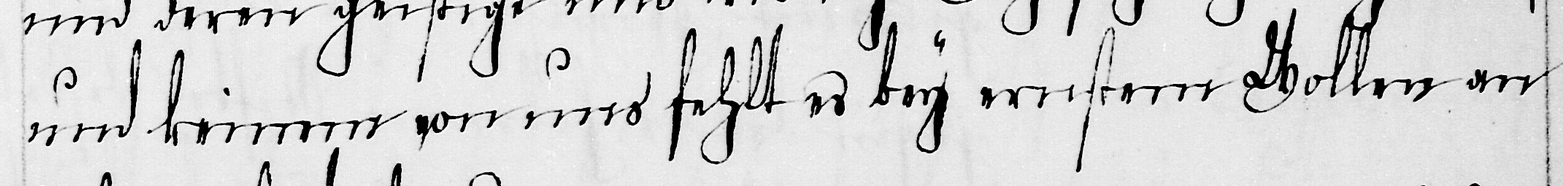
und keinem von uns fehlt es bey ernstem Wollen an
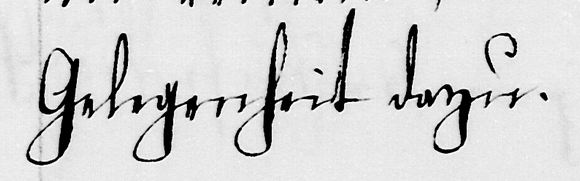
Gelegenheit dazu.
